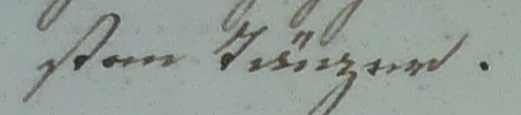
sten Tänzer .
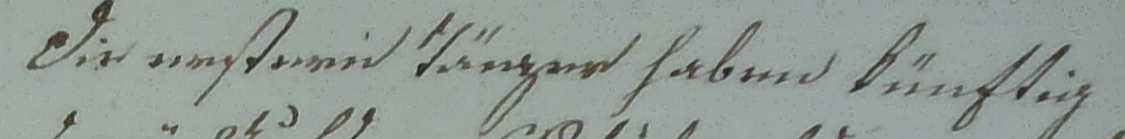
Die erstern Tänzer haben künftig
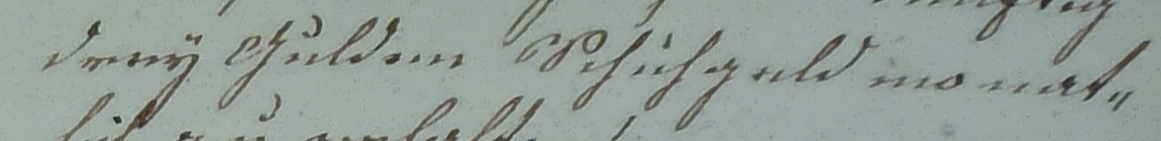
drey Gulden Schuhgeld monat¬
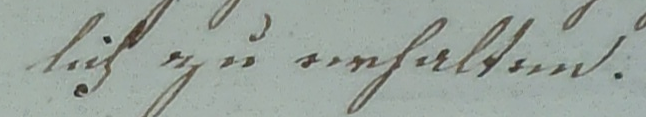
lich zu erhalten.
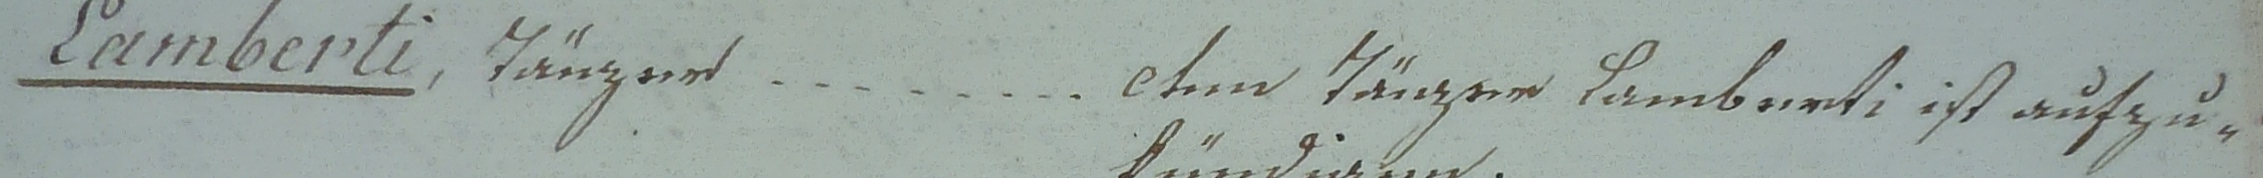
Lamberti, Tänzer …….. Dem Tänzer Lamberti ist aufzu¬
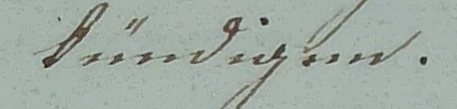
kündigen.
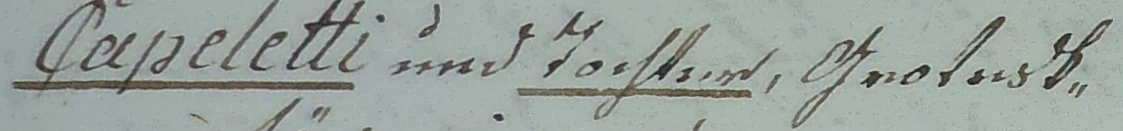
Capeletti und Tochter, Grotesk¬
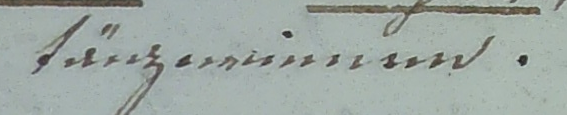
tänzerinnen.
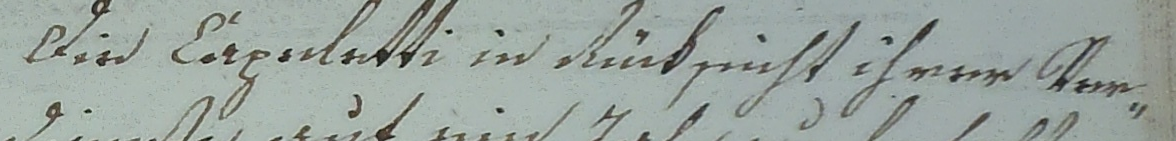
Die Capeletti in Rücksicht ihrer Ver¬
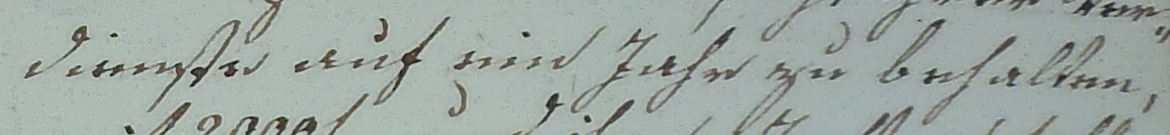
dienste auf ein Jahr zu behalten,
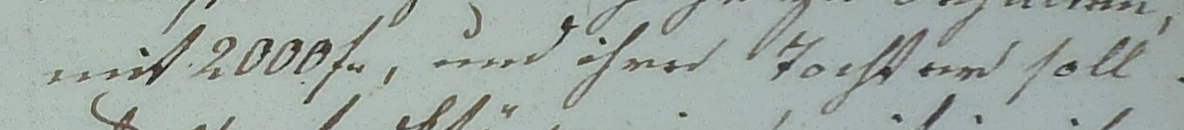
mit 2000fn, und ihre Tochter soll
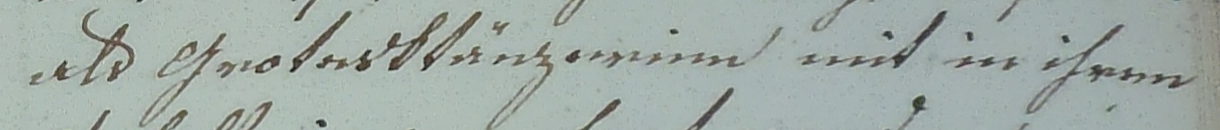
als Grotesktänzerinn mit in ihrem
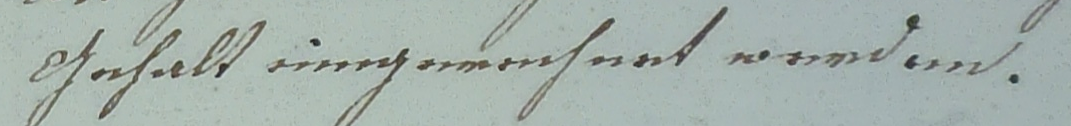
Gehalt eingerechnet werden.
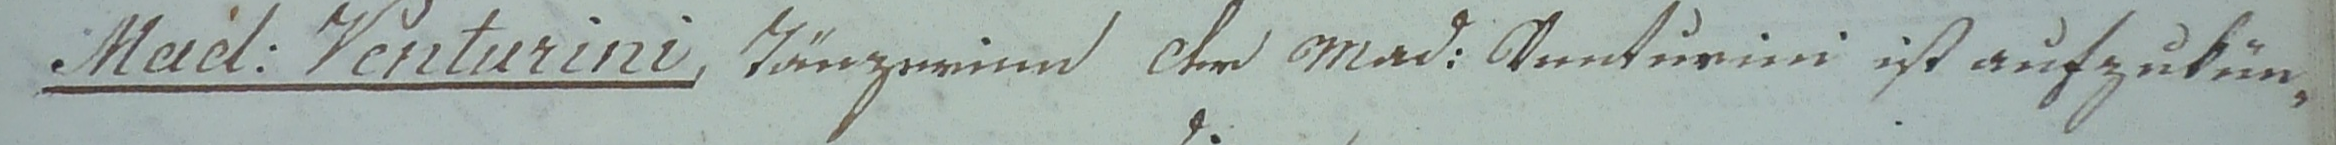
Mad: Venturini, Tänzerinn Der Mad: Venturini ist aufzukün¬
